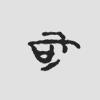可
